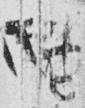姑（苦）
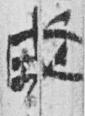○（成）
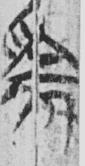○（家）
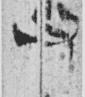父
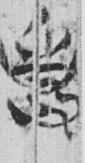事
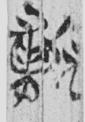○（厲）
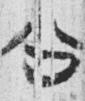公
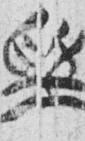爲
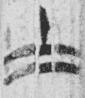士
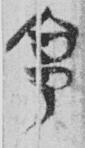○（序）
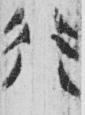行
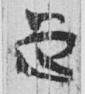正（政）
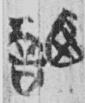○（迅）
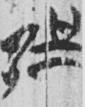○（強）
